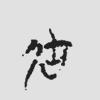居
